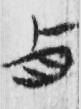貞
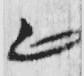㠯（以）
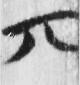亓（其）
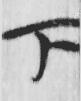下
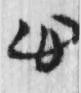心
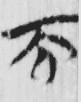而
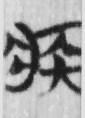疾
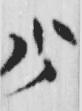少
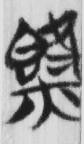○（氣）
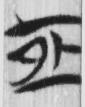亙（恆）
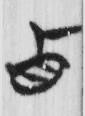貞
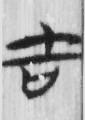吉
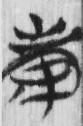庚
